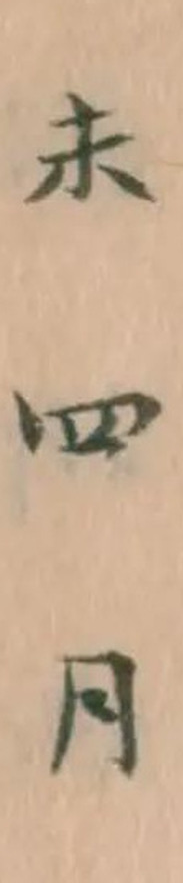未四月
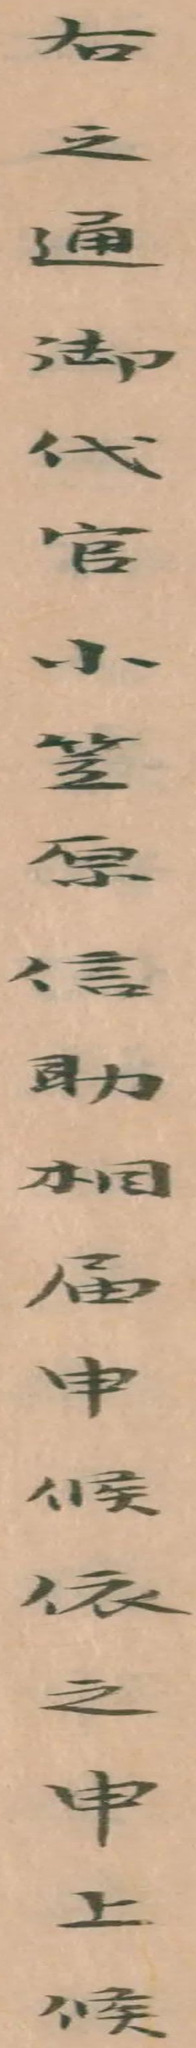右之通御代官小笠原信助相届申候依之申上候

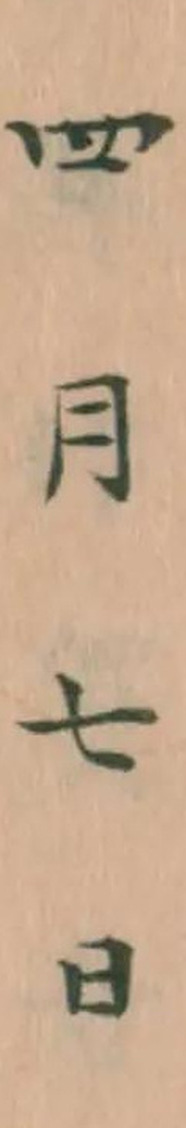四月七日
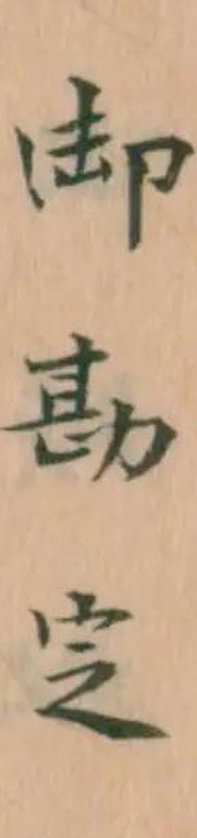御勘定
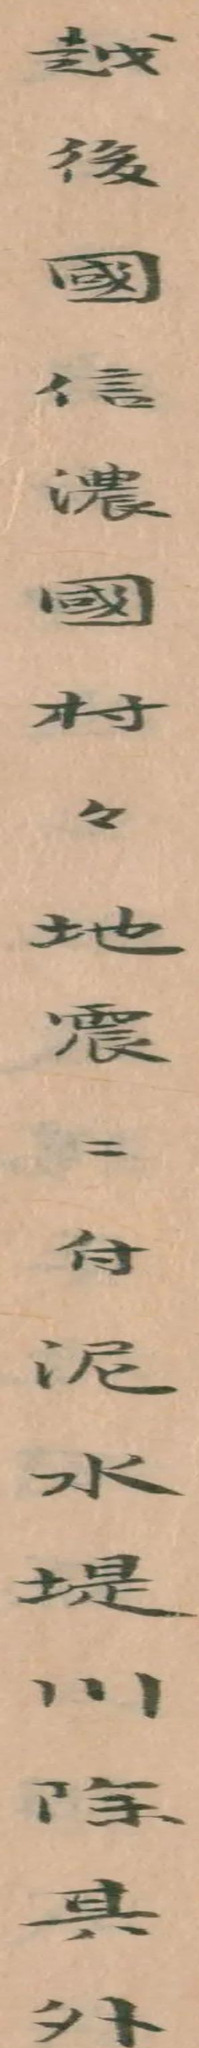越後国信濃国村々地震二付泥水堤川除其外
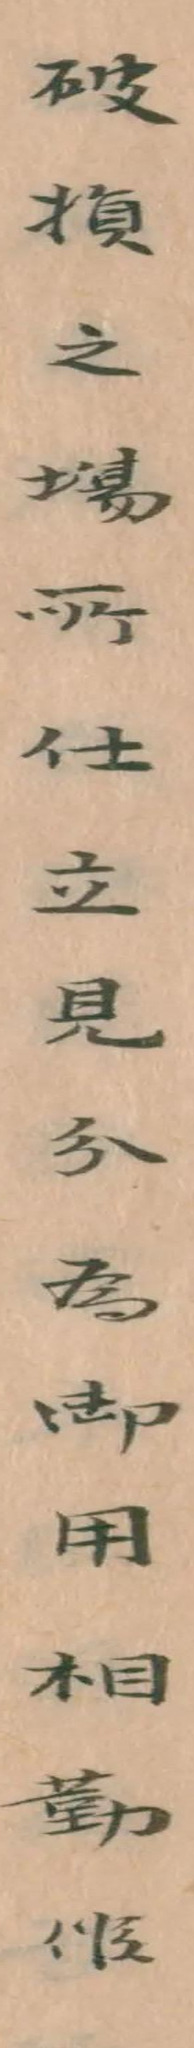破損之場所仕立見分為御用相勤候
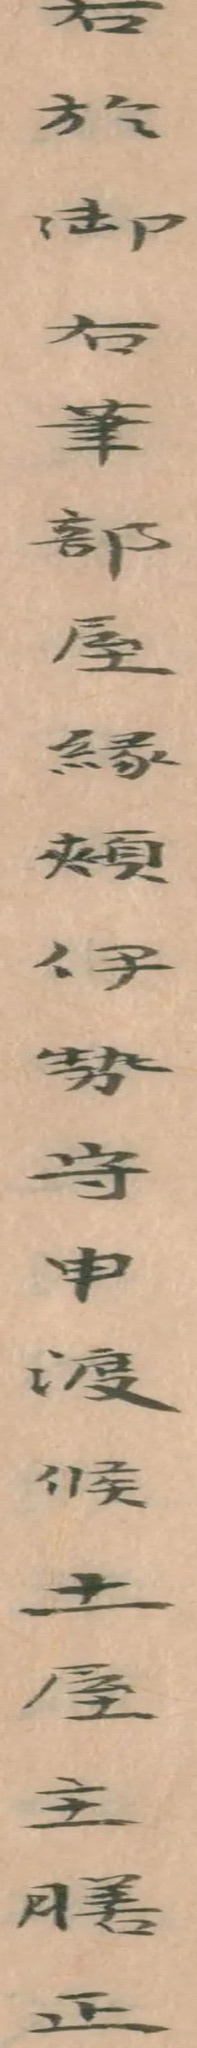右於御右筆部屋縁頬伊勢守申渡候土屋主膳正
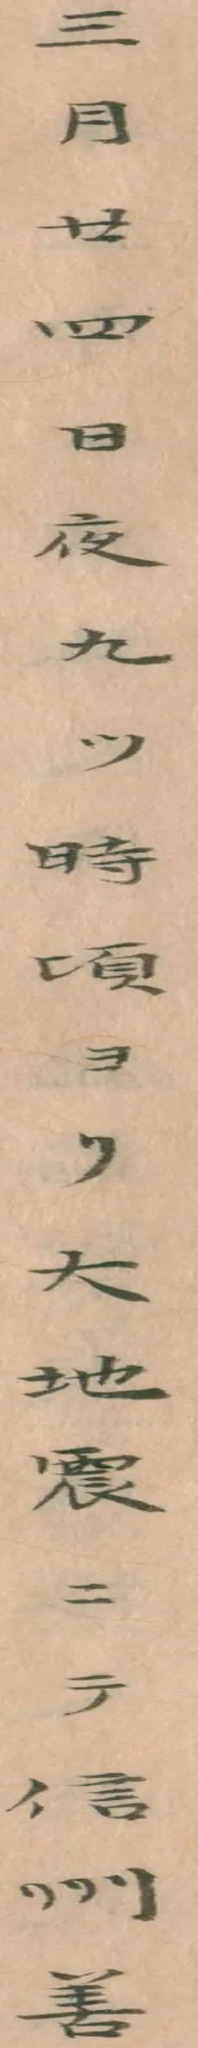三月廿四日夜九ッ時頃ヨリ大地震ニテ信州善
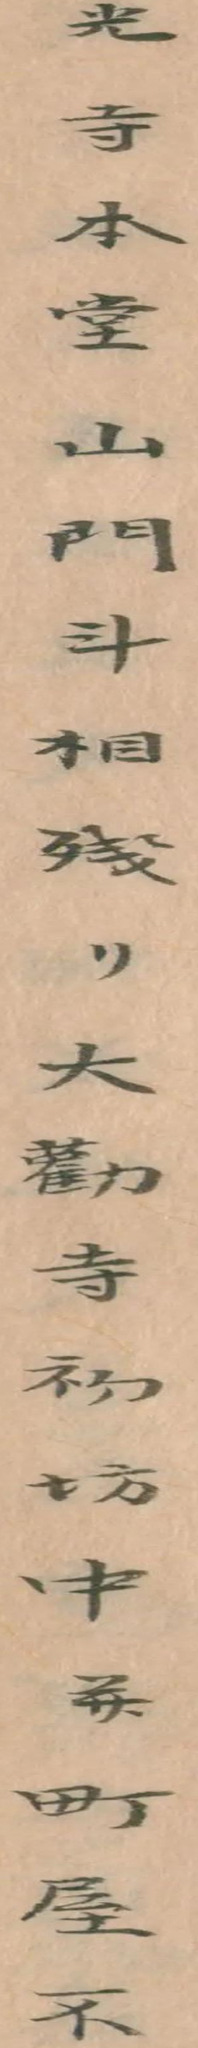光寺本堂山門斗相残リ大勧進初坊中并町家不

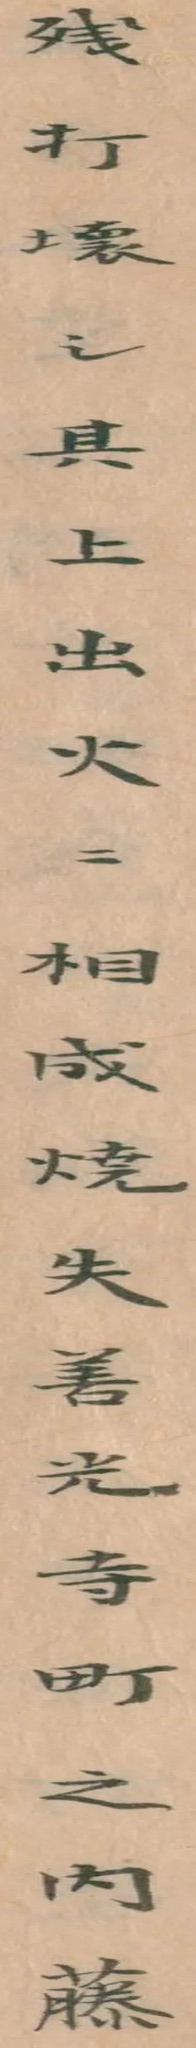残打壊シ其上出火二相成焼失善光寺町之内藤
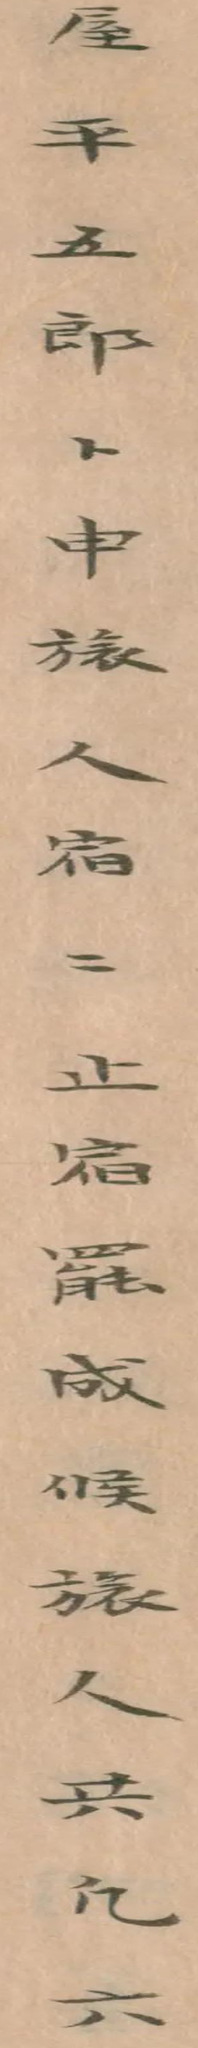屋平五郎ト申旅人宿二止宿罷成候旅人共凡六
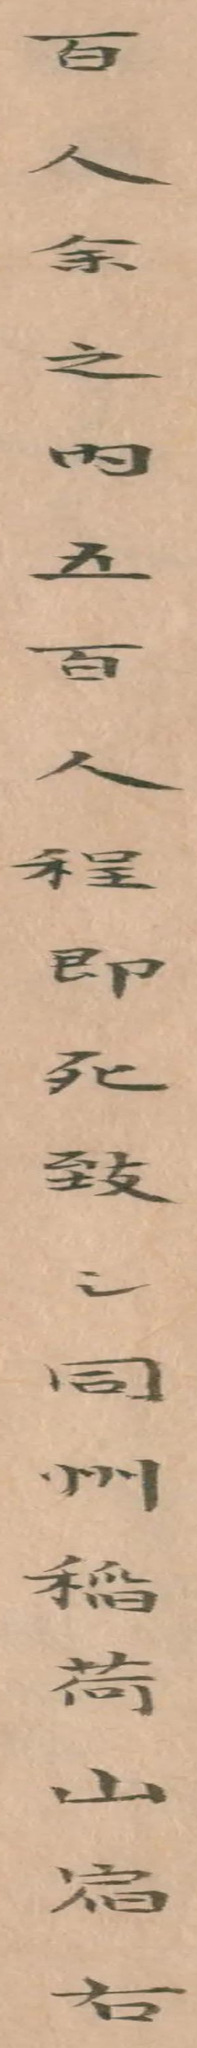百人余之内五百人程即死致シ同州稲荷山宿右
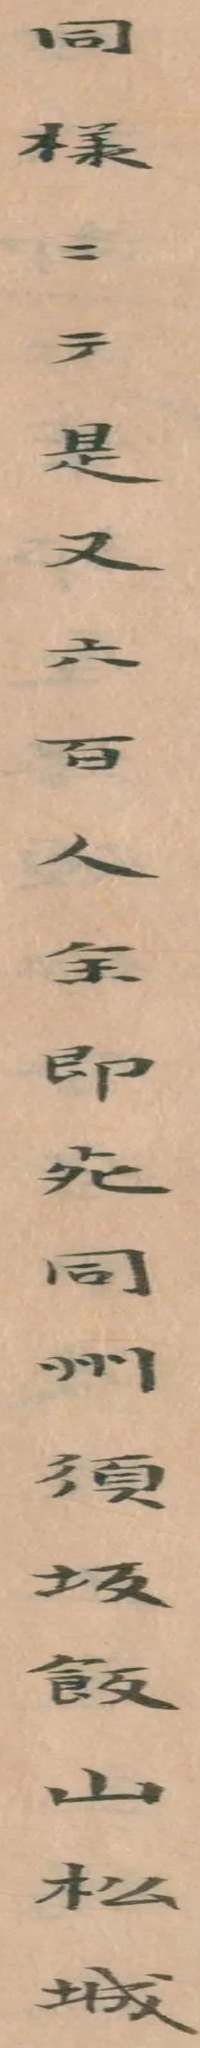同様ニテ是又六百人余即死同州須坂飯山松城
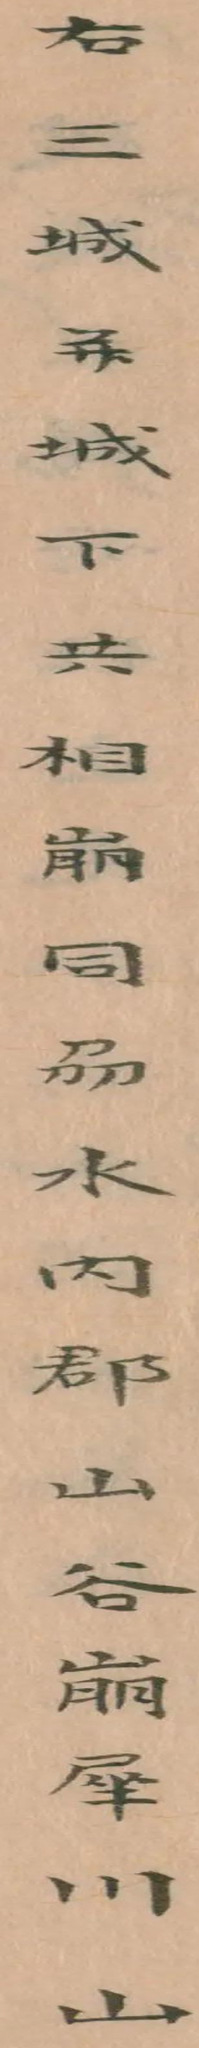右三城并城下共相崩同州水内郡山谷崩犀川山
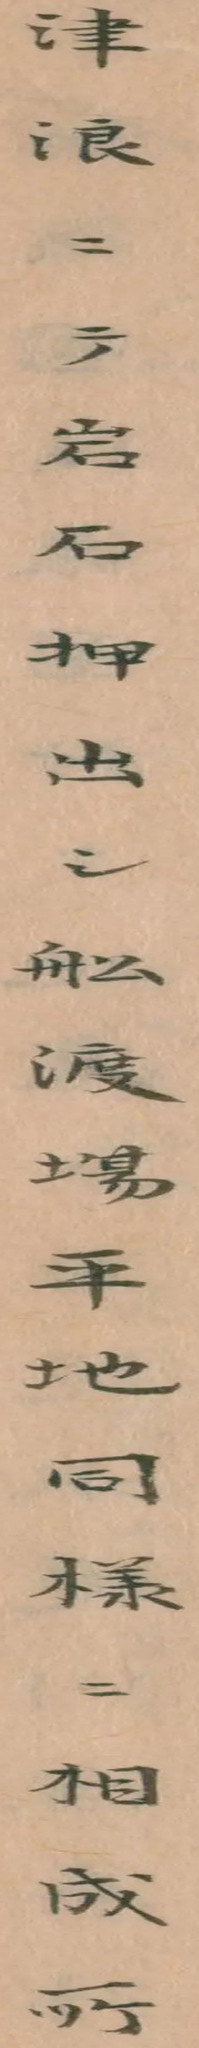津浪ニテ岩石押出シ渡船場平地同様二相成所
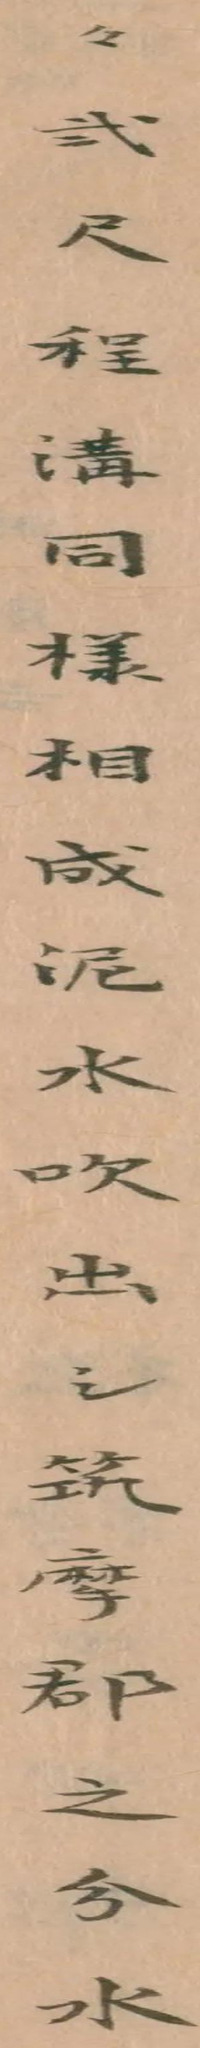々弐尺程溝同様相成泥水吹出シ筑摩郡之分水
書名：地災撮要. 巻1(噴火山・地震ノ部)
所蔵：国立国会図書館 National Diet Library, JAPAN
